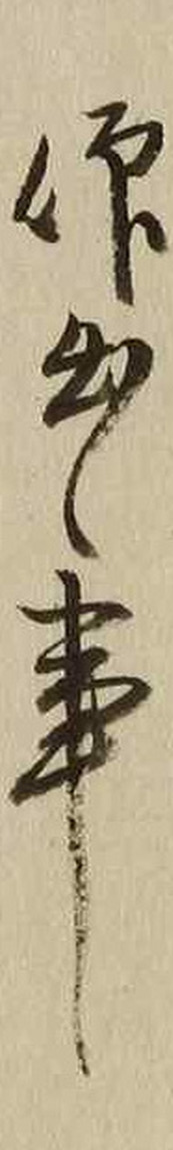仰出候事
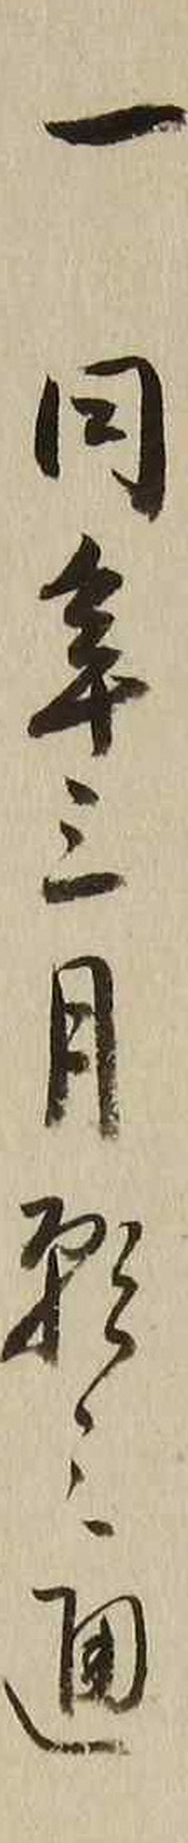一同年三月願之通
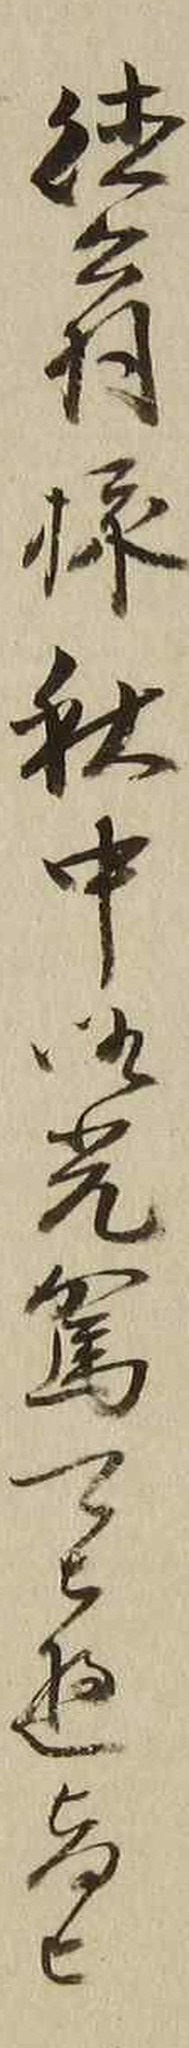徳翁様秋中御光駕被遊旨被
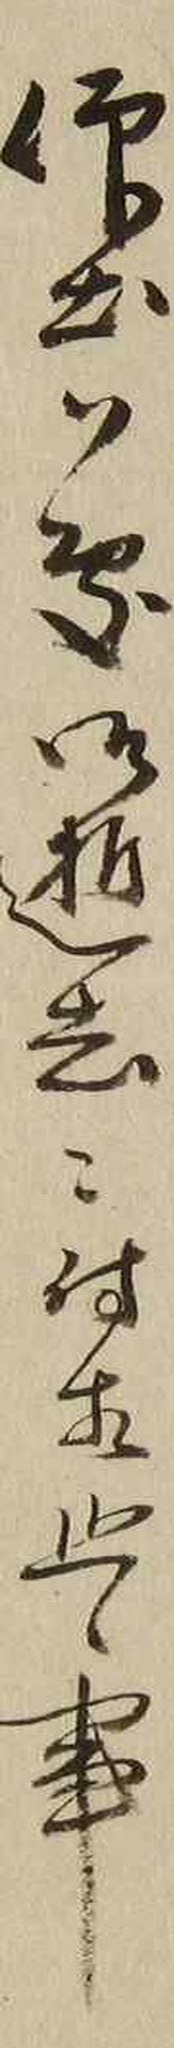仰出候処御逝去に付相止候事
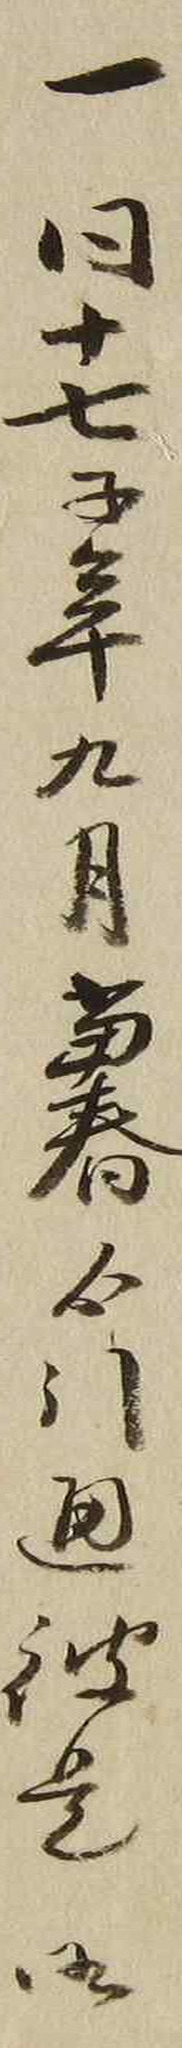一同十七子年九月当春ゟ引通彼是御
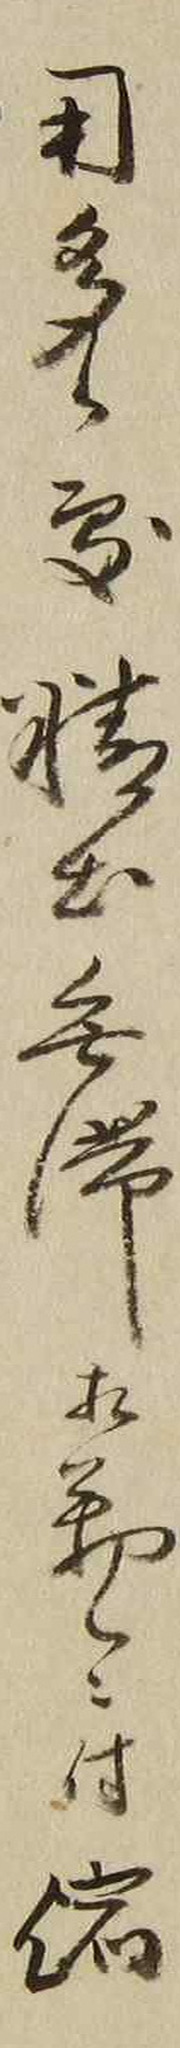用多候処精出無滞相勤候に付縮
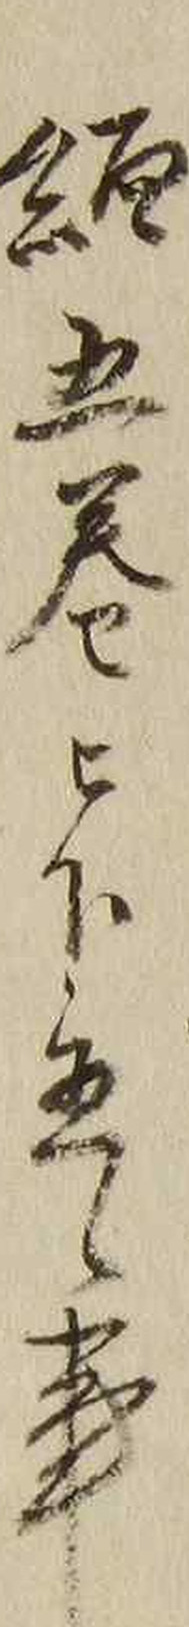緬五巻被下置候事
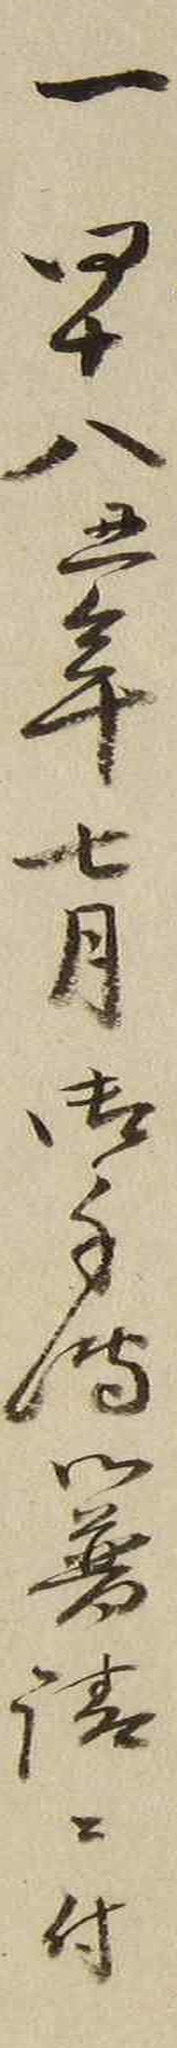一同十八丑年七月御手伝御普請に付
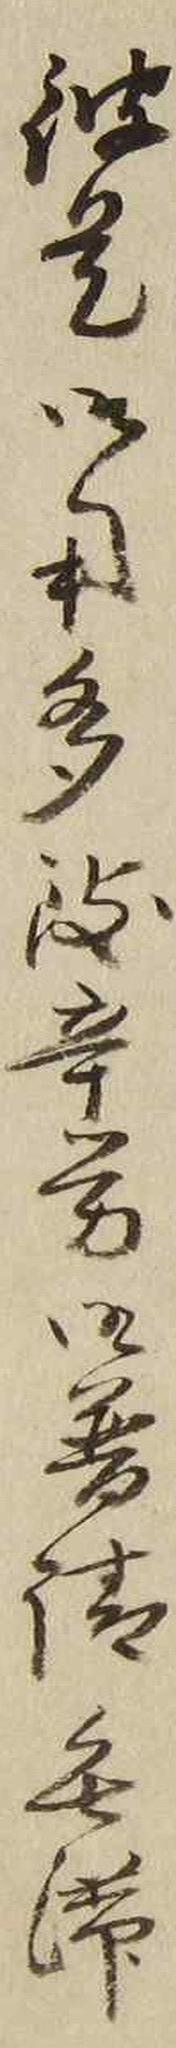彼是御用多致辛労御普請無滞
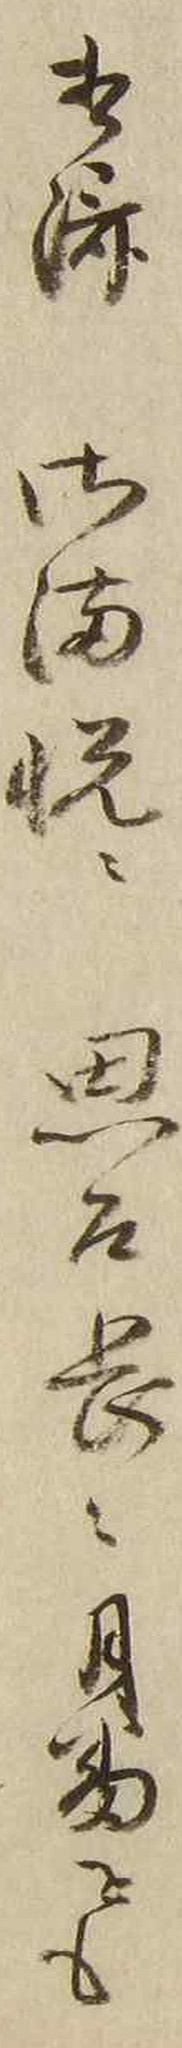相済御満悦被思召長々月番をも

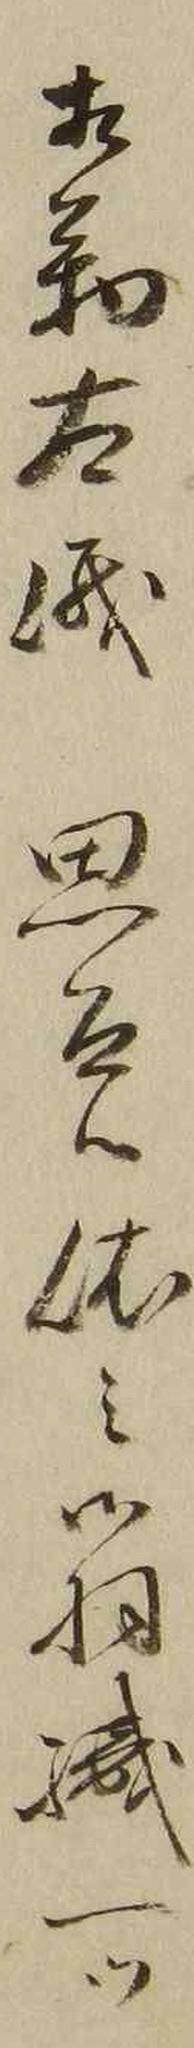相勤大儀思召候依之御羽織一つ
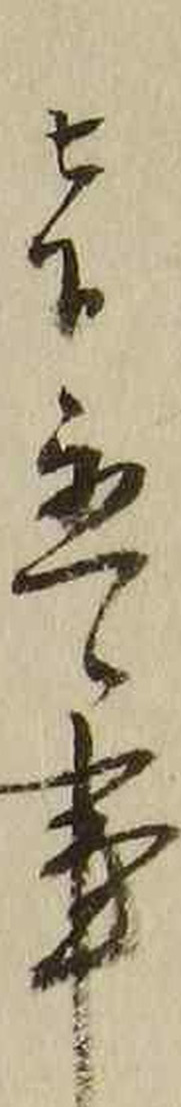被下置候事
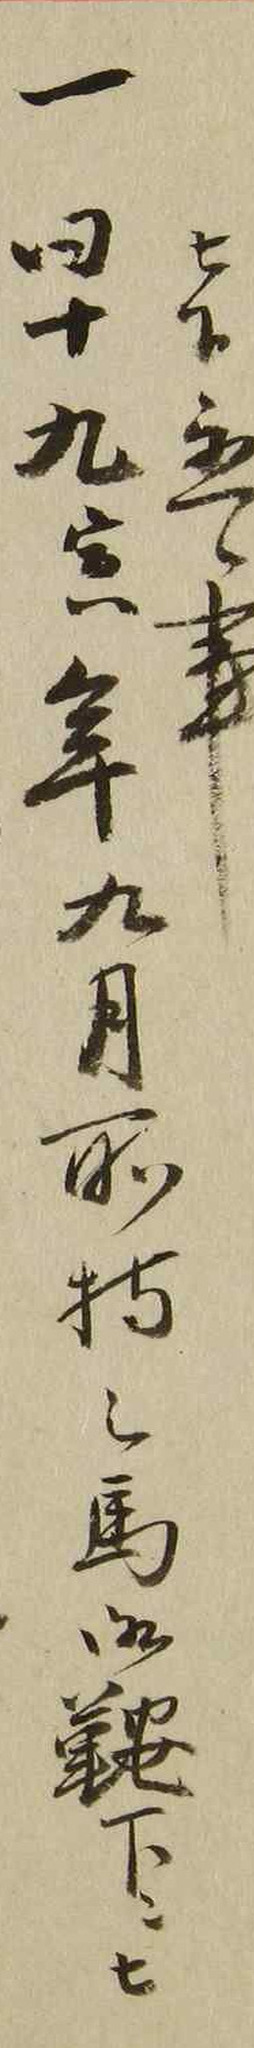一同十九寅年九月所持之馬御鞍下に被
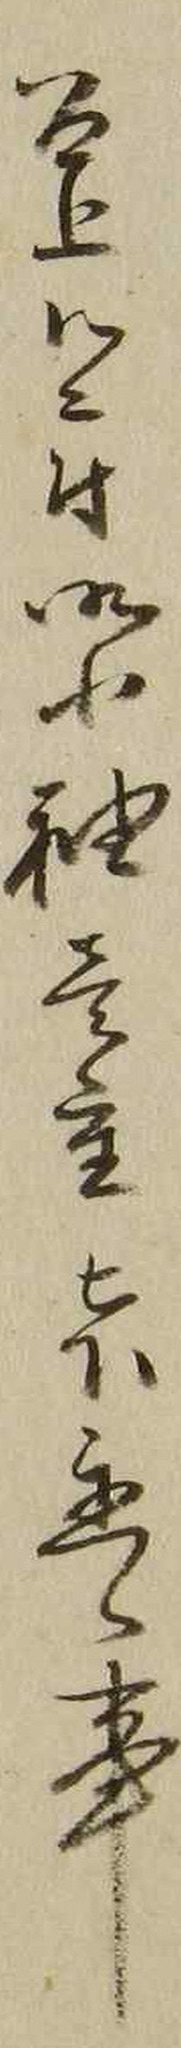召上候に付御小袖壱重被下置候事
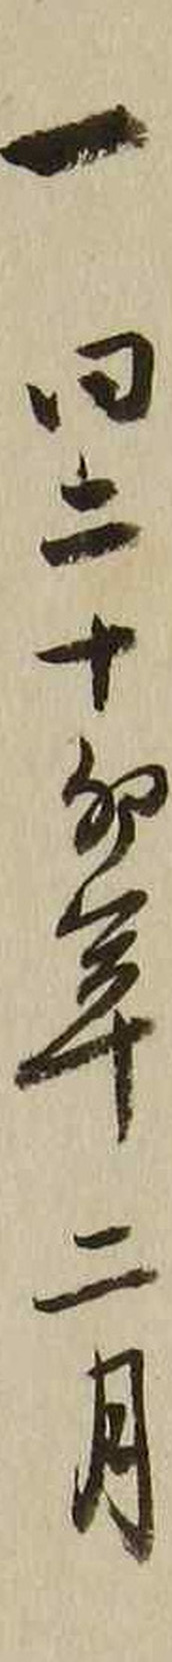一同二十卯年二月
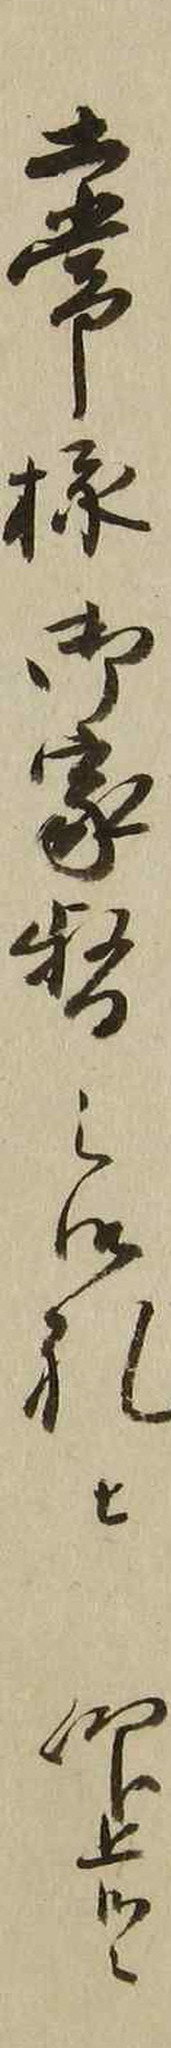土常様御家督之御礼被仰上候に
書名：諸士系譜　巻之269　さ之部1
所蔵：会津若松市立会津図書館
